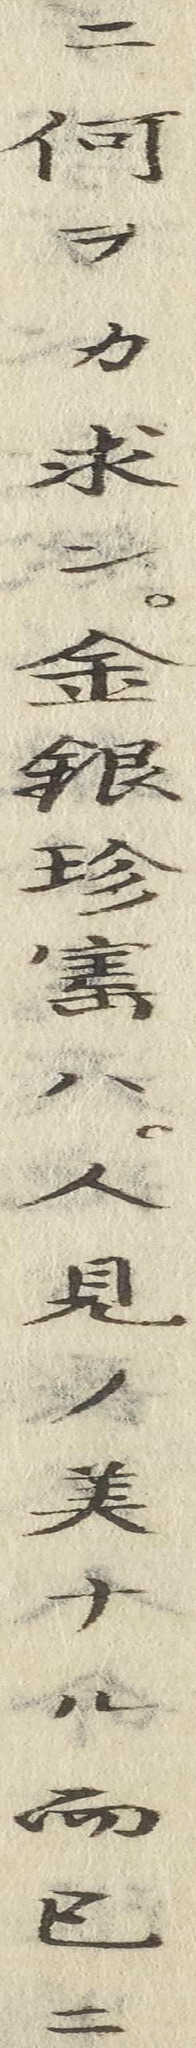ニ何ヲカ求ン。金銀珍宝ハ。人見ノ美ナル而已ニ
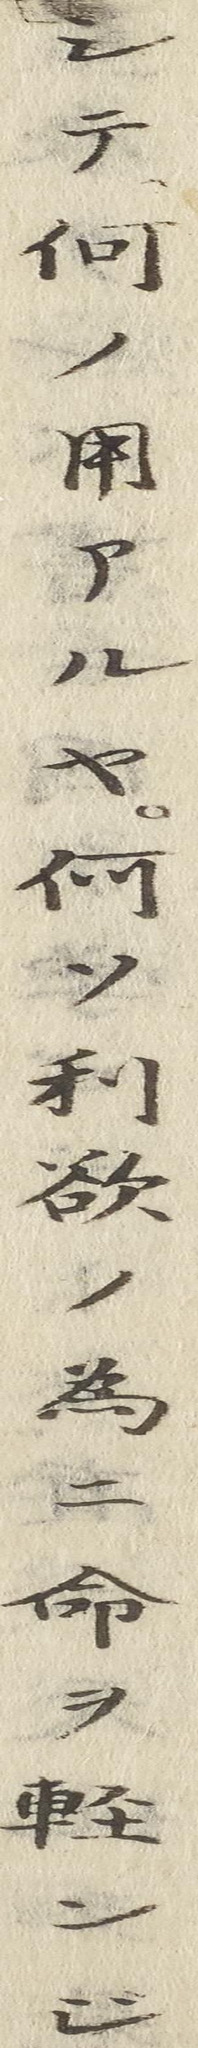シテ何ノ用アルヤ。何ソ利欲ノ為ニ命ヲ軽ンジ
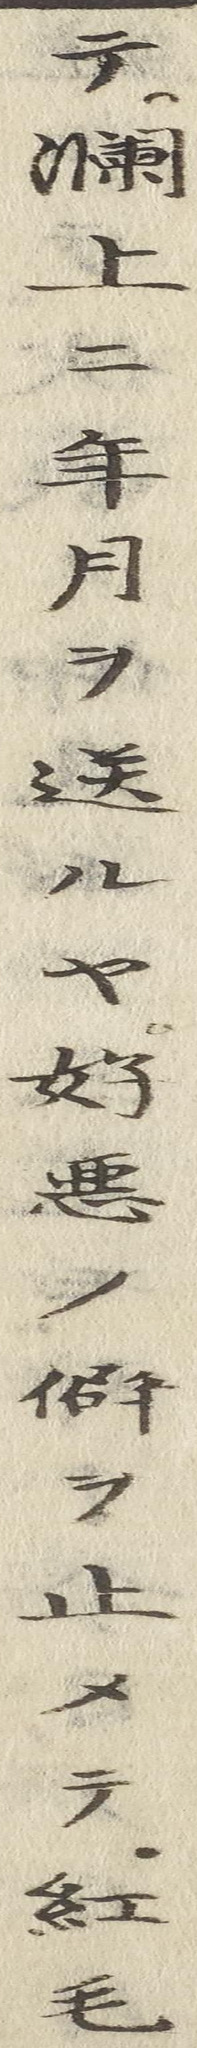テ。瀾上ニ年月ヲ送ルヤ。好悪ノ僻ヲ止メテ。紅毛
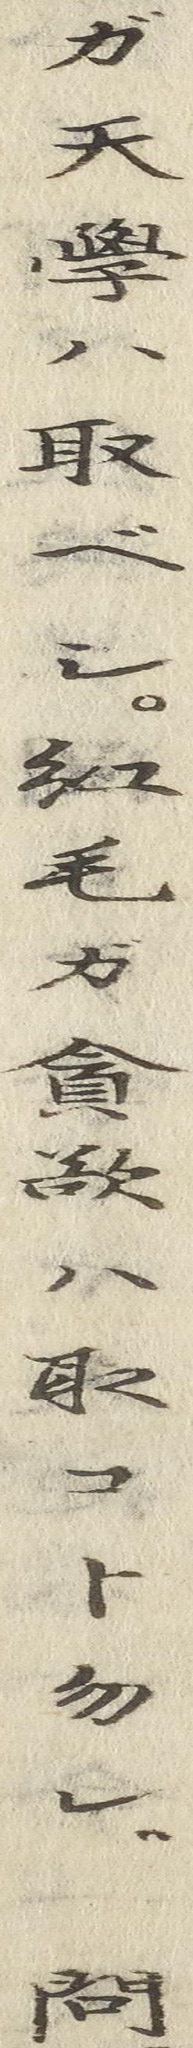ガ天学ハ取ベシ。紅毛ガ貪欲ハ取コト勿レ。問。
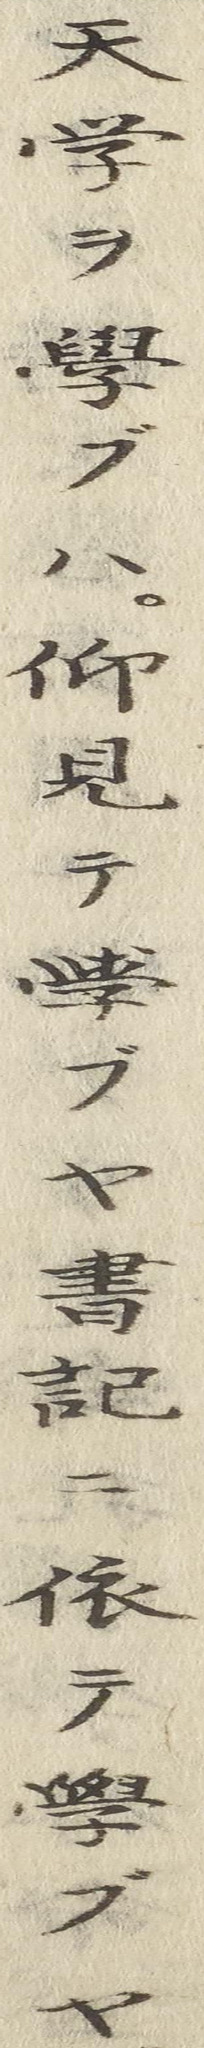天学ヲ学ブハ。仰見テ学ブヤ書記ニ依テ学ブヤ。
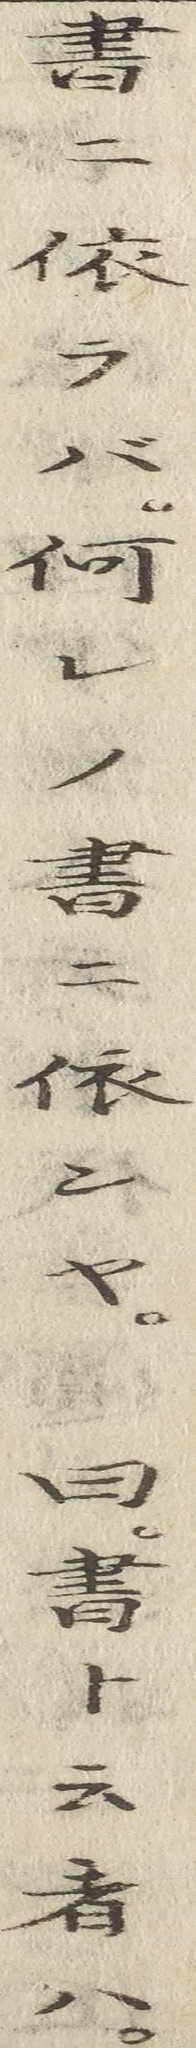書ニ依ラバ。何レノ書ニ依ンヤ。曰。書ト云者ハ。

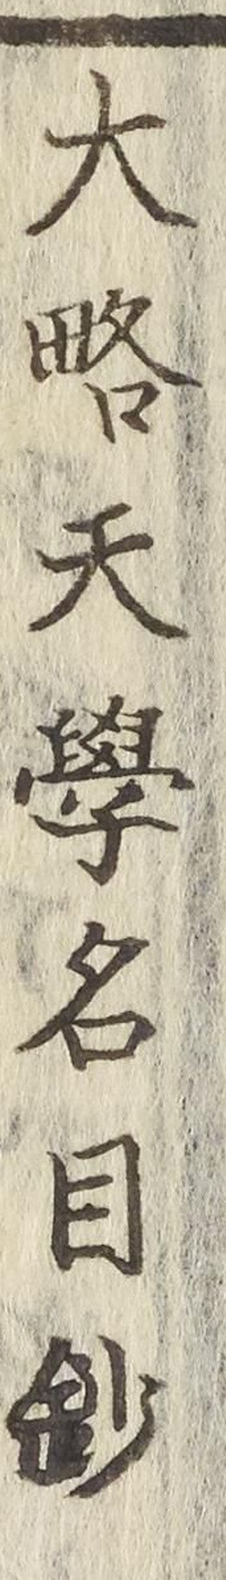大略天学名目鈔
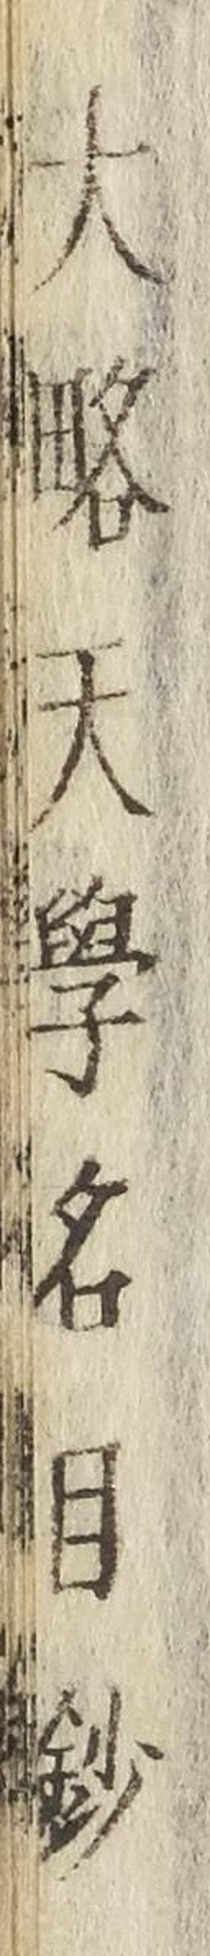大略天学名目鈔

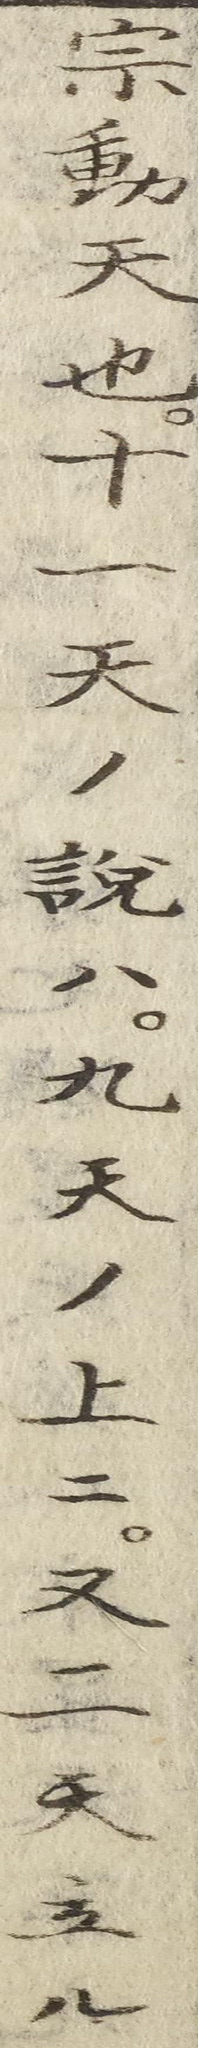宗動天也。十一天ノ説ハ。九天ノ上ニ。又二天立ル

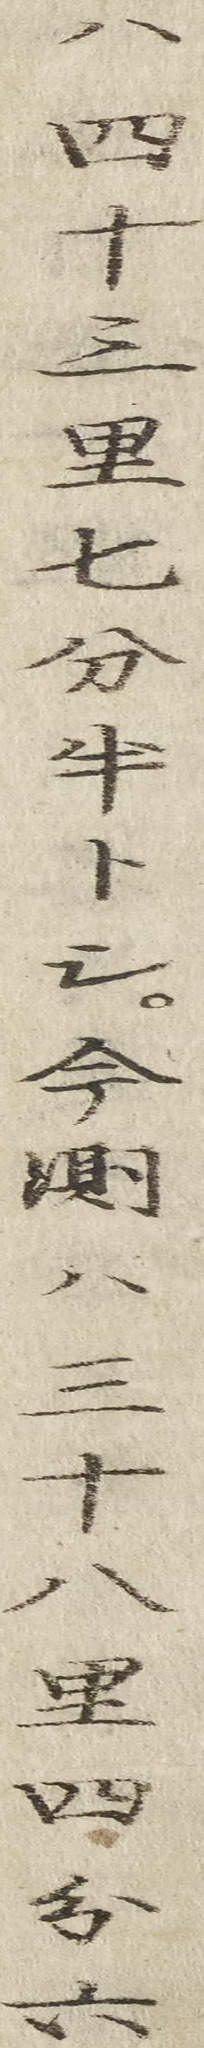ハ四十三里七分半トシ。今測ハ三十八里四分六
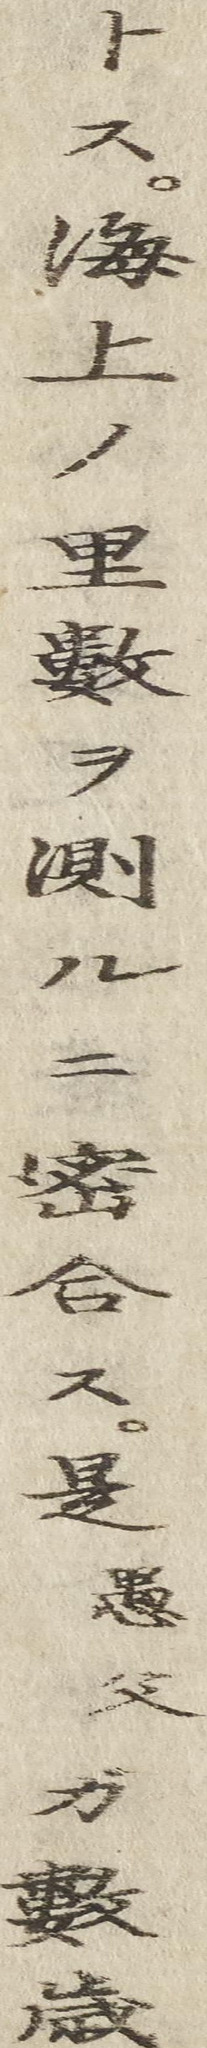トス。海上ノ里数ヲ測ルニ密合ス。是愚父ガ数歳
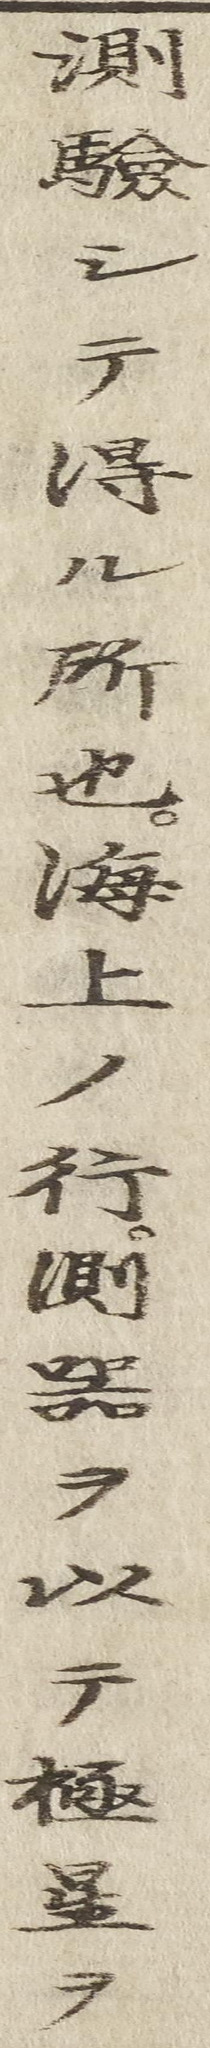測験シテ得ル所也。海上ノ行。測器ヲ以テ極星ヲ
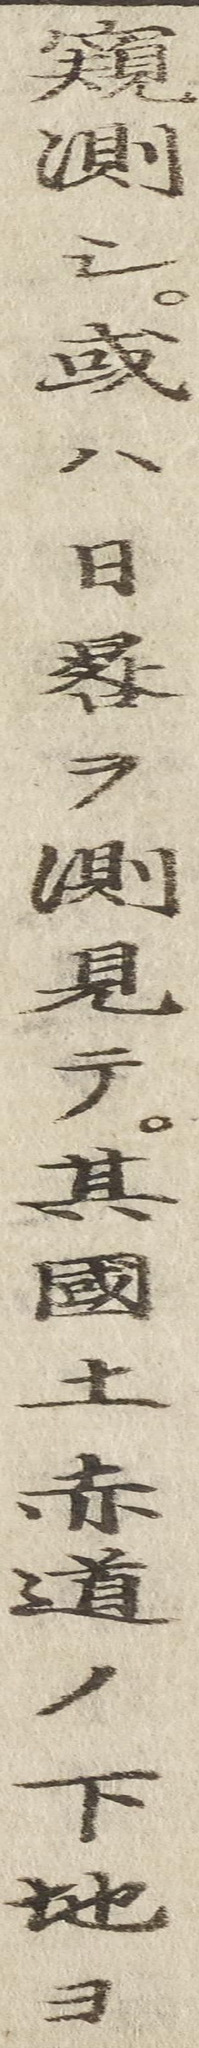窺測シ。或ハ日晷ヲ測見テ。其国土赤道ノ下地ヨ
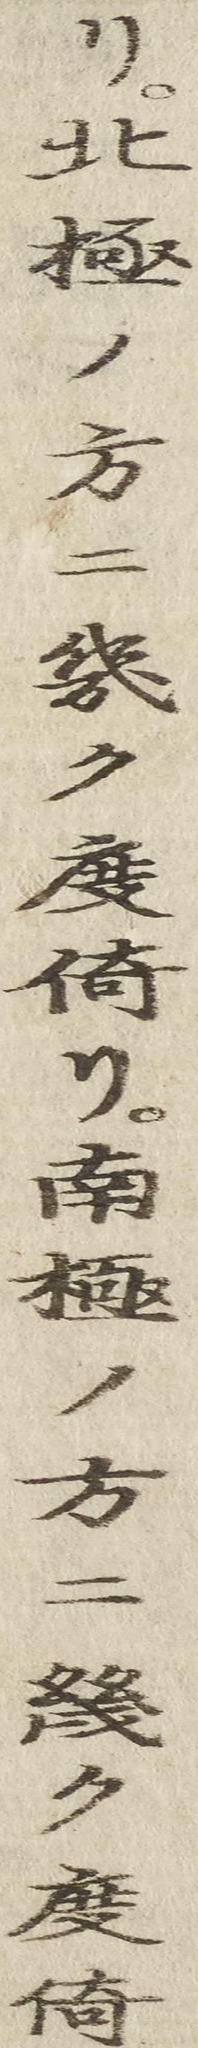リ。北極ノ方ニ幾ク度倚り。南極ノ方ニ幾ク度倚
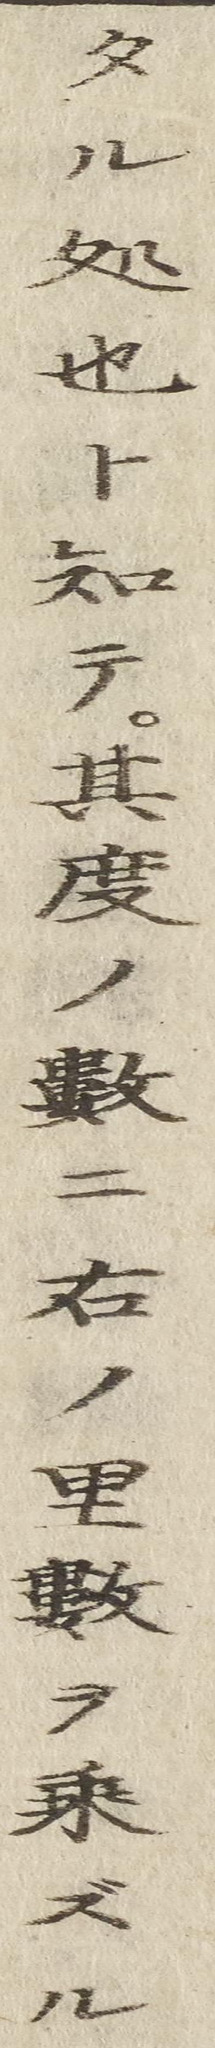タル処也ト知テ。其度ノ数ニ右ノ里数ヲ乗ズル
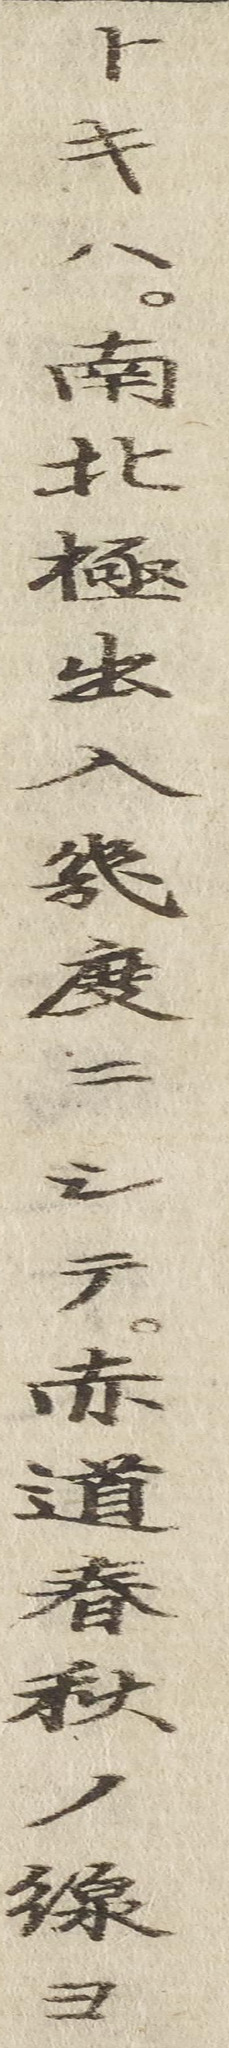トキハ。南北極出入幾度ニシテ。赤道春秋ノ線ヨ
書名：大略天学名目鈔　天經或問附録
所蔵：東京大学地震研究所図書室 Earthquake Research Institute Library, The University of Tokyo, JAPAN
